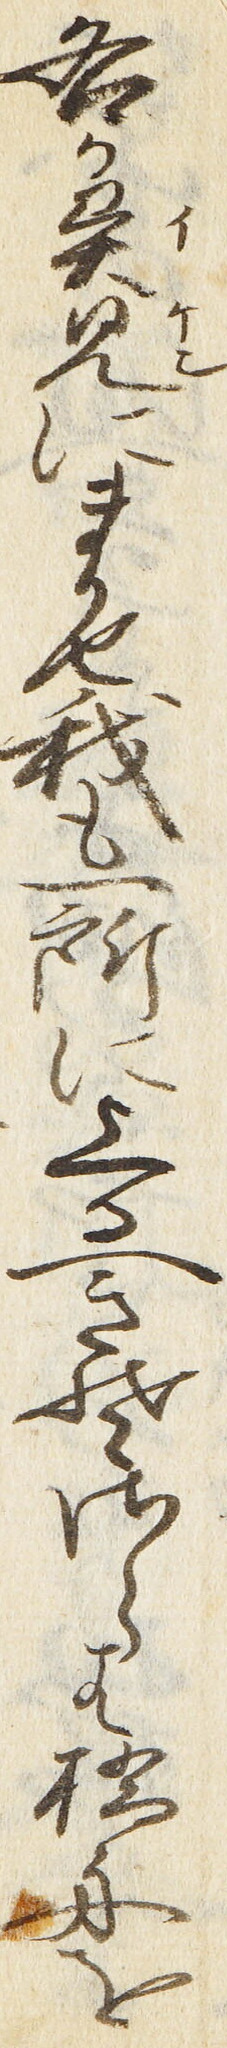各か異見にまかせ我も一所に上るへきそさらは橋舟を
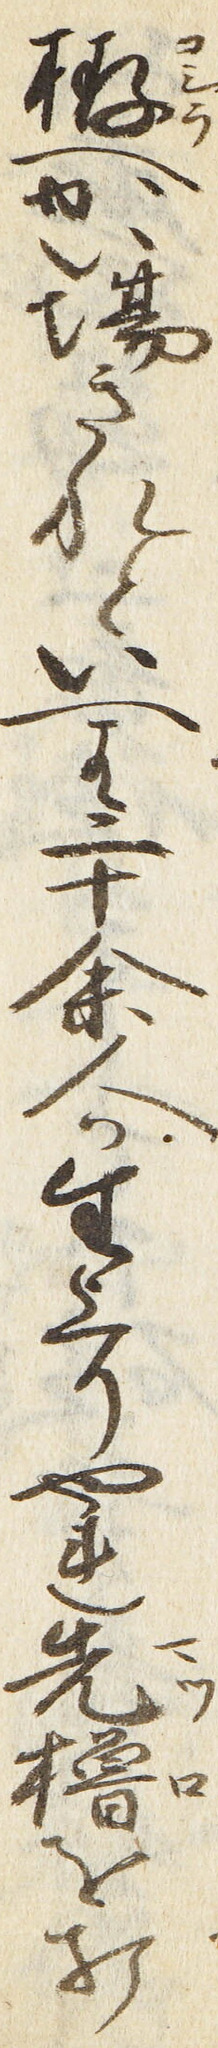拵へかい場きれといへは二十余人か生上りやれ先櫓を打
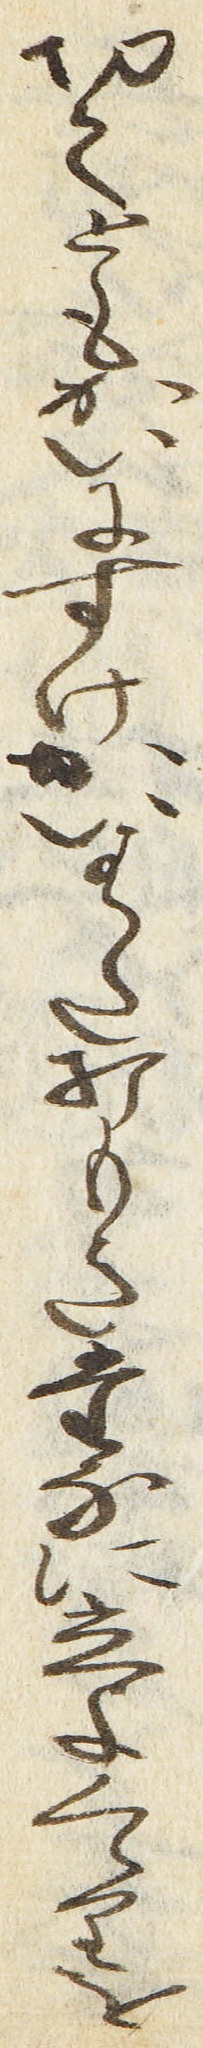切てともかいにすけかいはた打もきたなに立よくゝりを
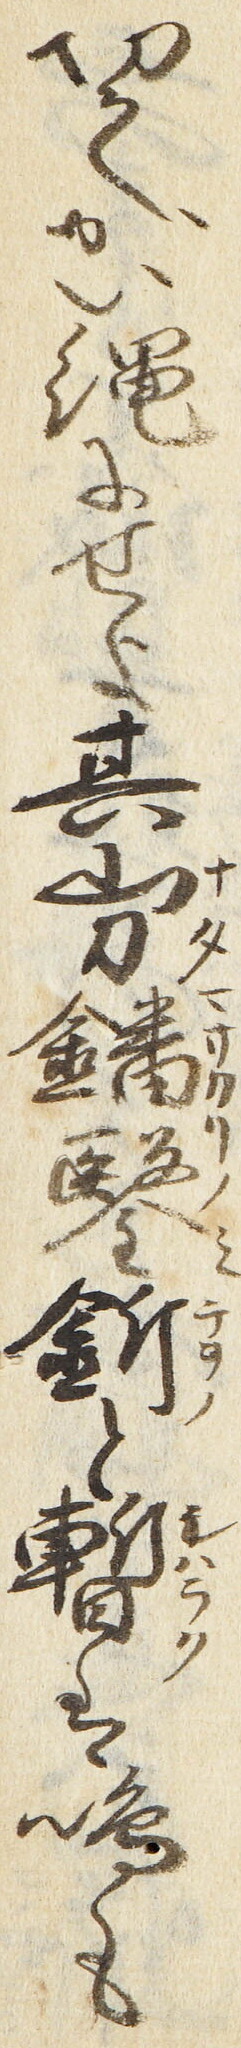切てかい縄にせよ其山刀鐇鑿釿と暫は鳴くも

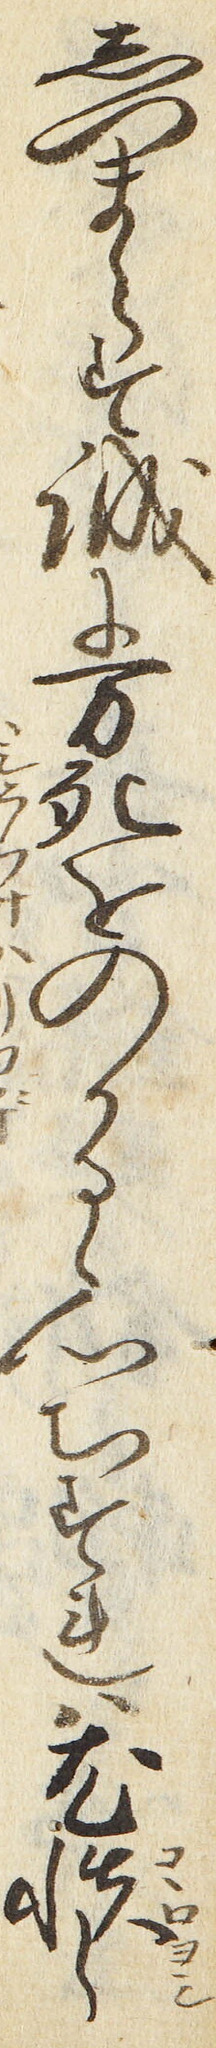しつまらす誠に万死をのかるゝ心ちすれは尤快し
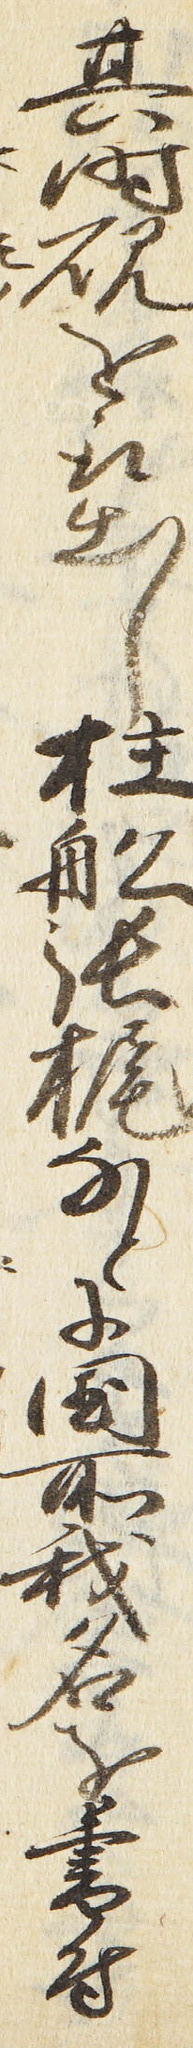其内硯を取出し柱船張梶なとに国所我名を書付
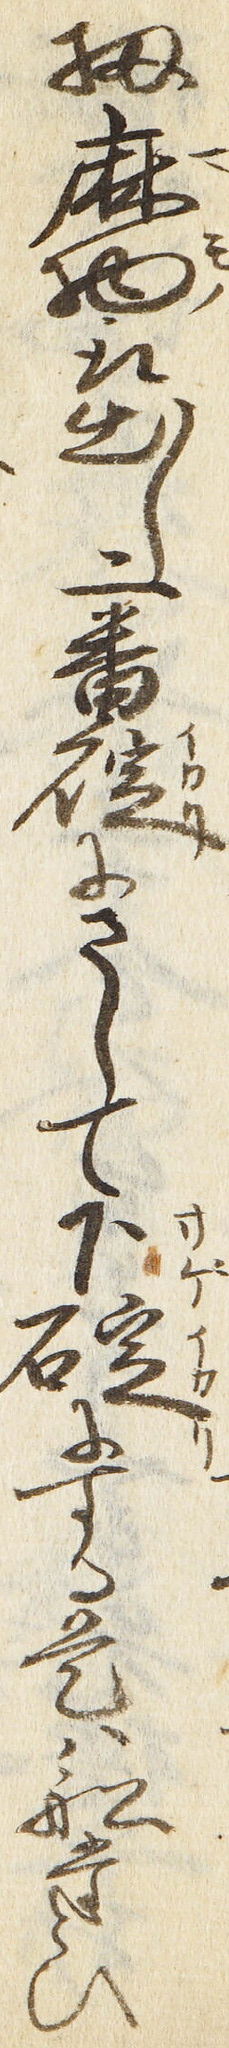扨麻物取出し二番碇にさして下碇にする是は船たとひ
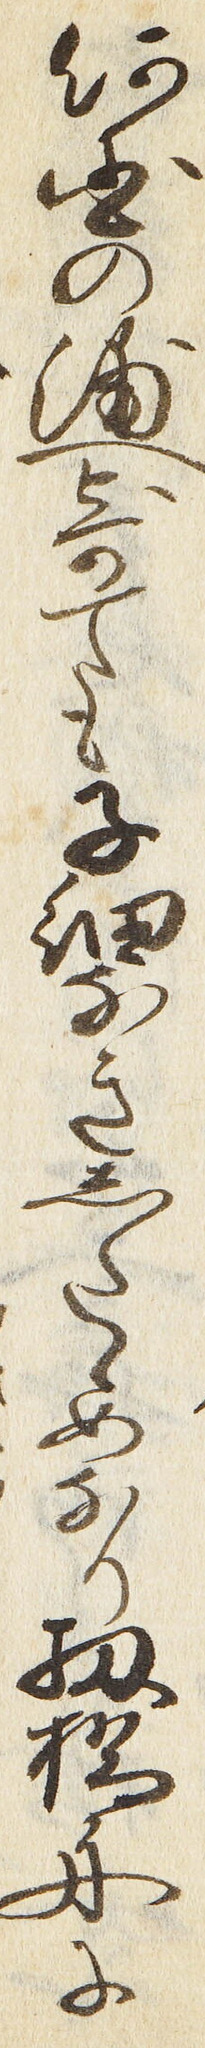何国の浦へ寄ても子細なきしたゝめなり扨橋舟に
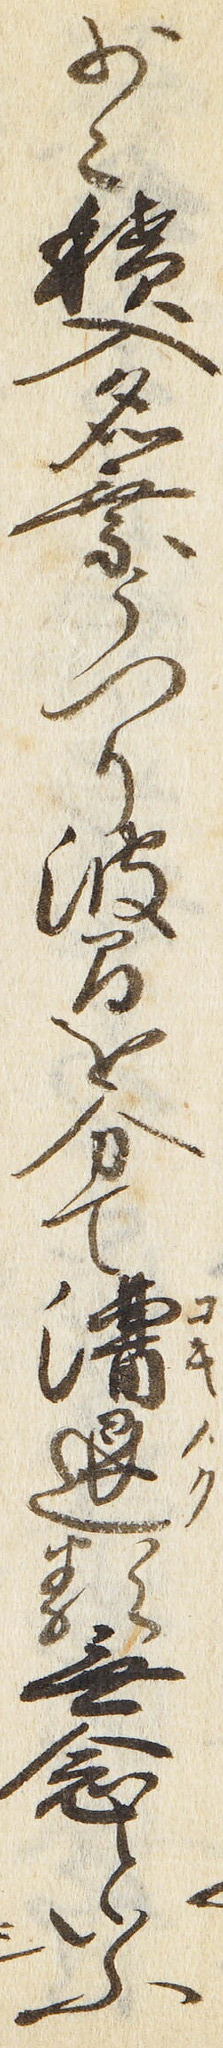少々積入各乗うつり波間を分て漕退る無念といふ
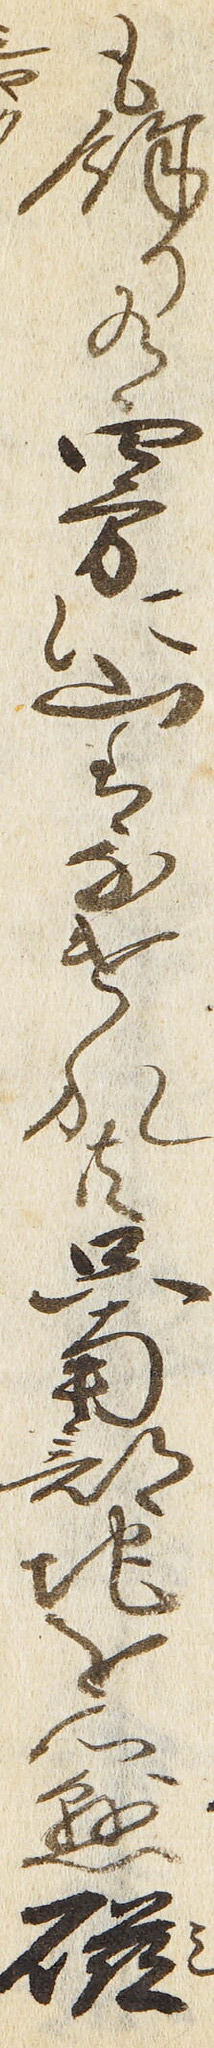も余り有四方に山はなけれ共只南部地を心懸磁
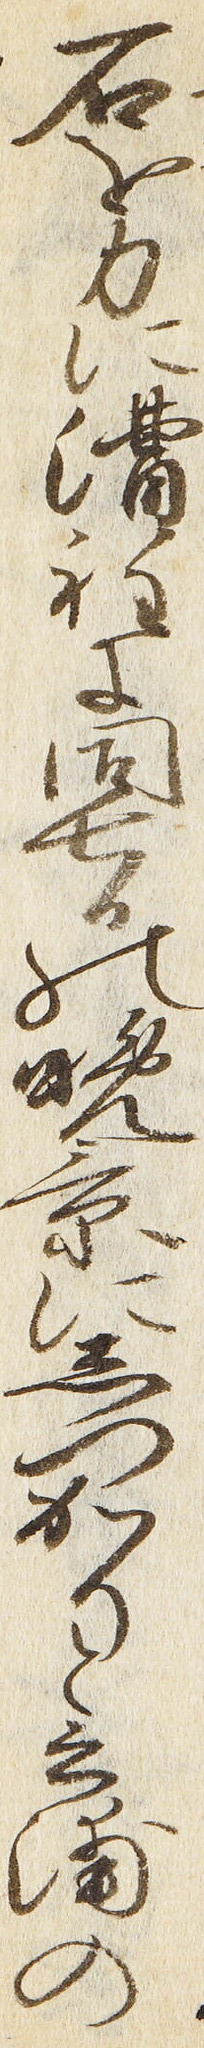石を力に漕程に同七日の晩景にしつかりと云浦の
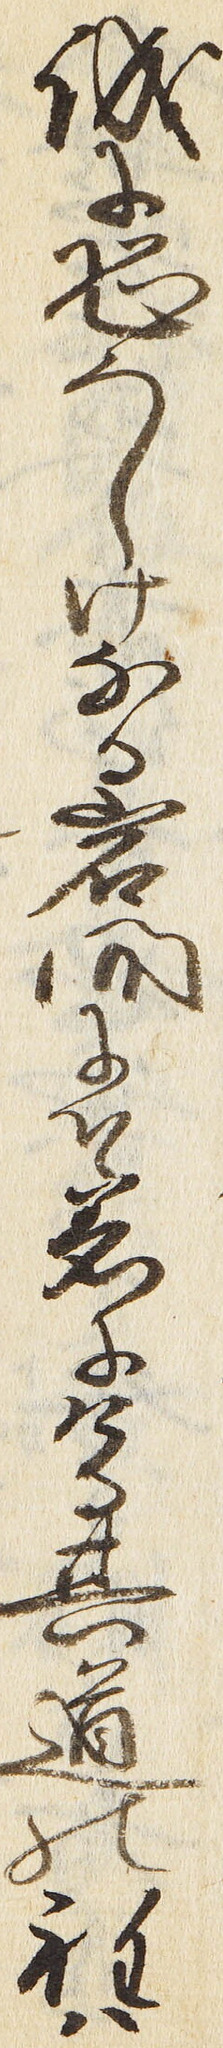誠に恐ろしけなる岩間にそ着にける其道の程は
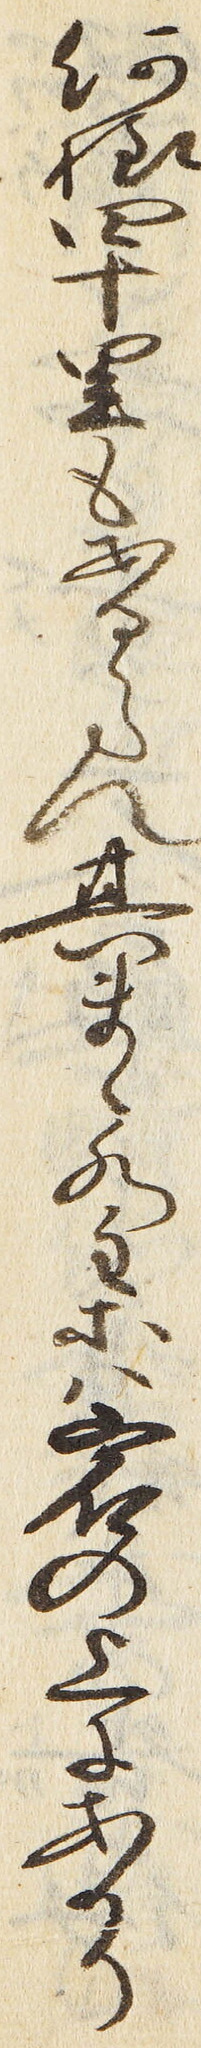何様四十里もあるらん其まゝ水主等ハ岩の上にあかり
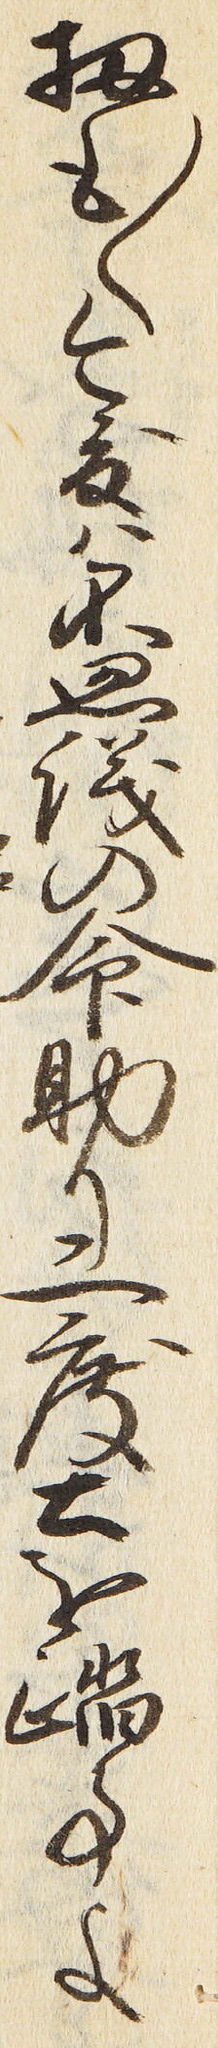扨も〳〵今度ハ不思議の命助り二度土を踏事よ
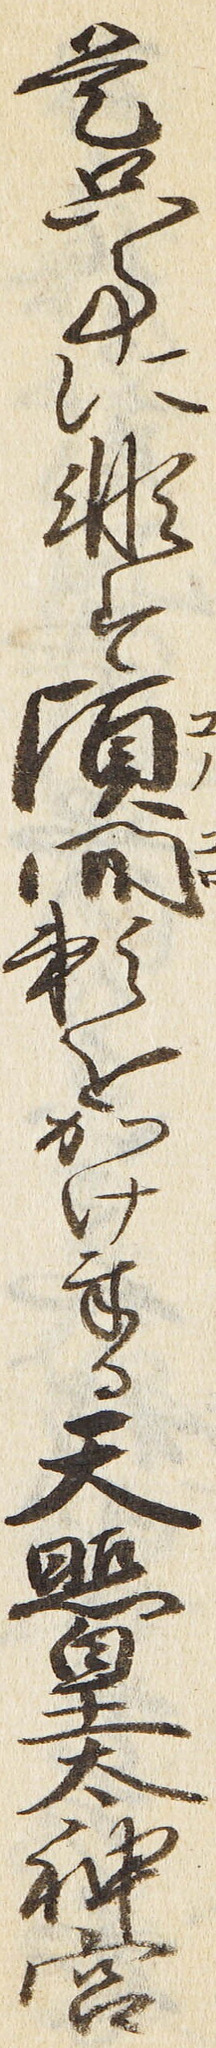是只事に非す頃間頼をかけたる天照皇太神宮
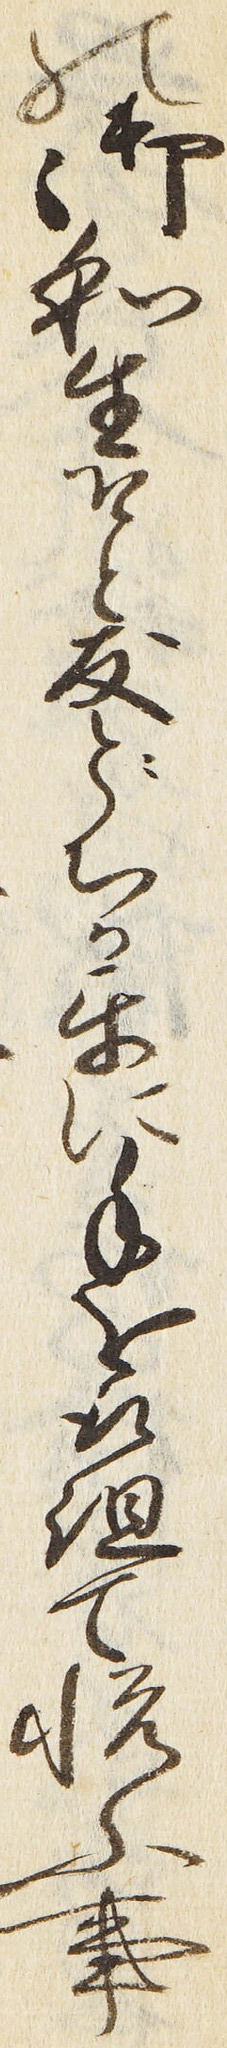の御和生そと友どちか互に手を取組て悦ふ事
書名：海陸世話日記
